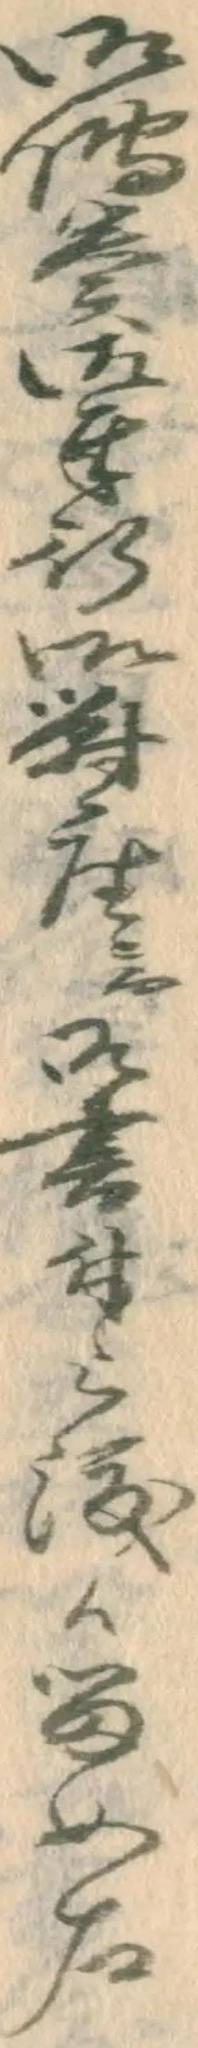御伝奏御奉行御対座ニ而御書付被渡候留如左
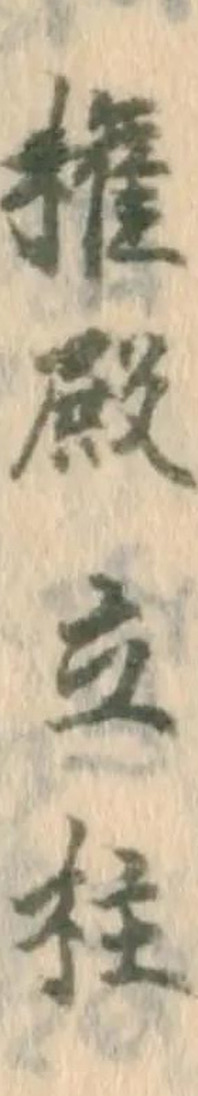權殿立柱
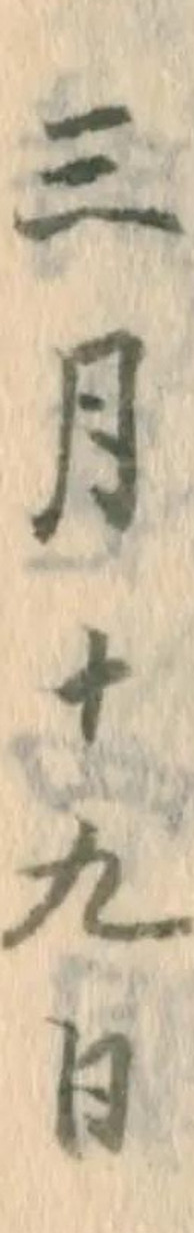三月十九日
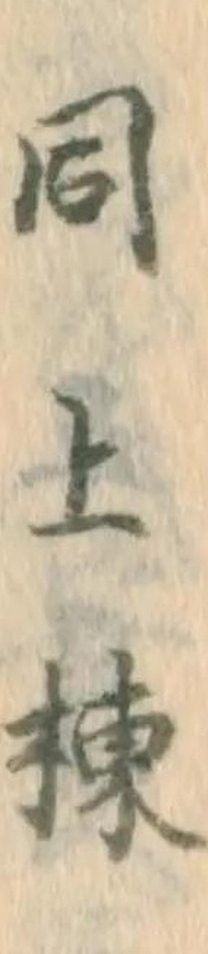同上棟
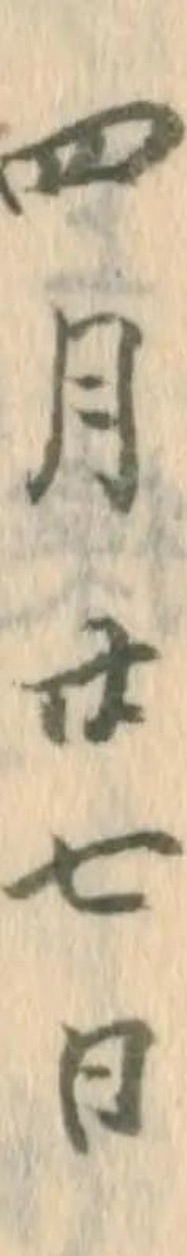四月廿七日
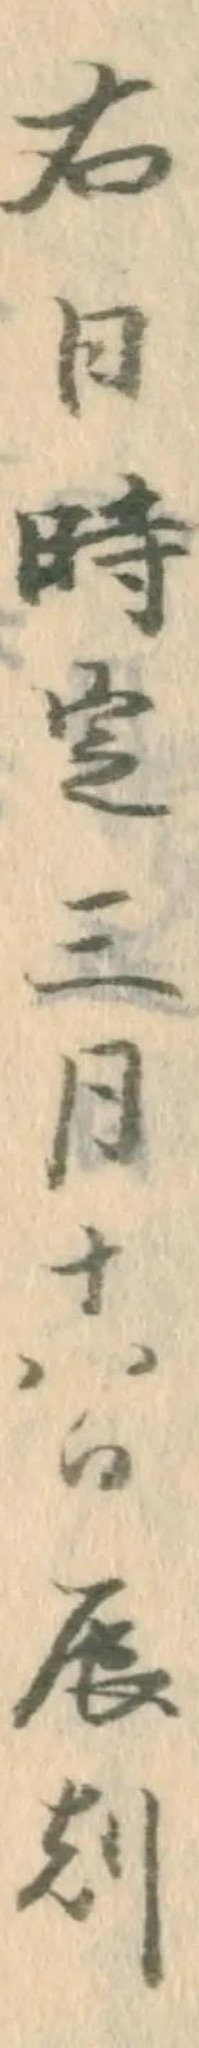右日時定三月十八日辰刻
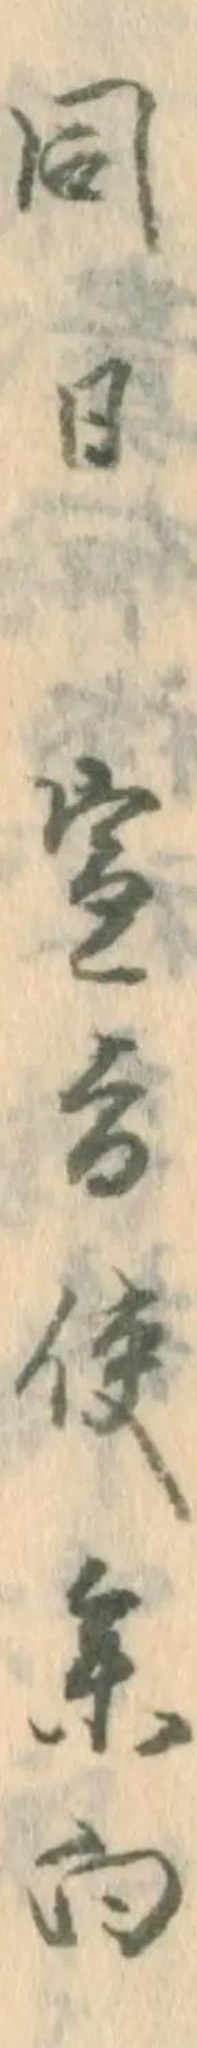同日宣旨使参向

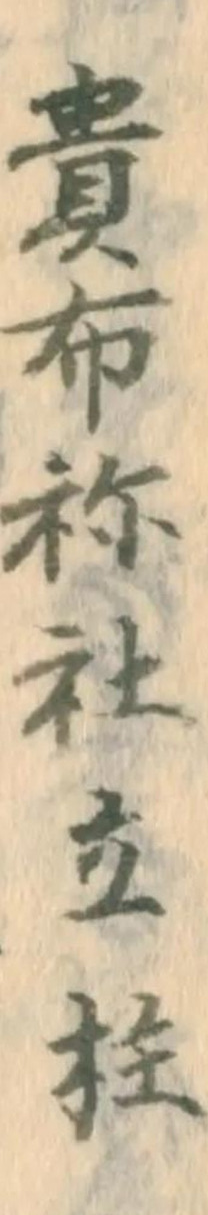貴布祢社立柱
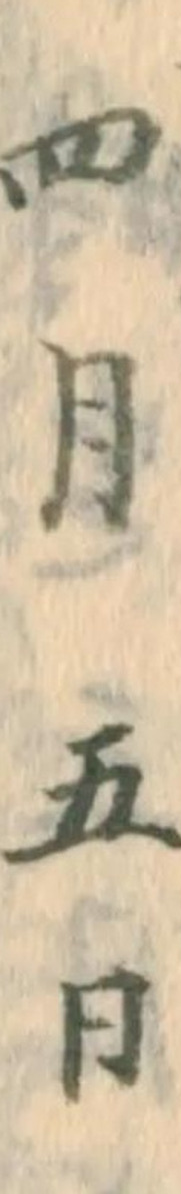四月五日
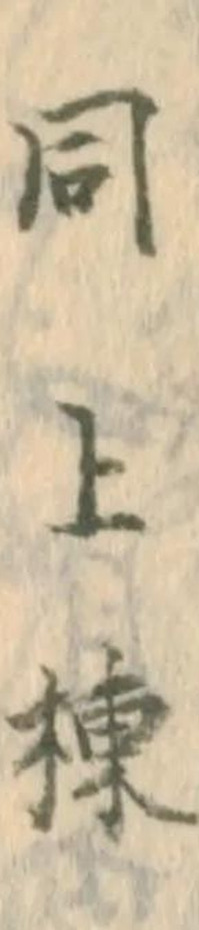同上棟
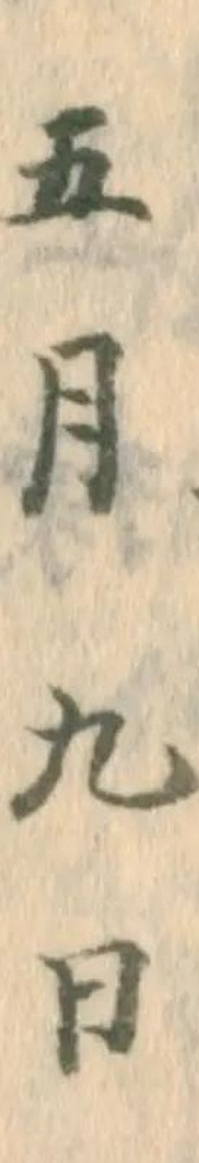五月九日
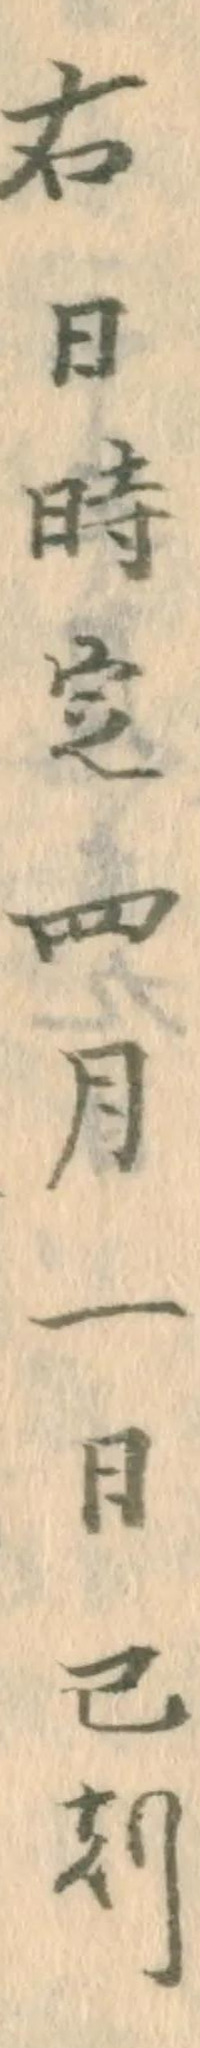右日時定四月一日巳刻
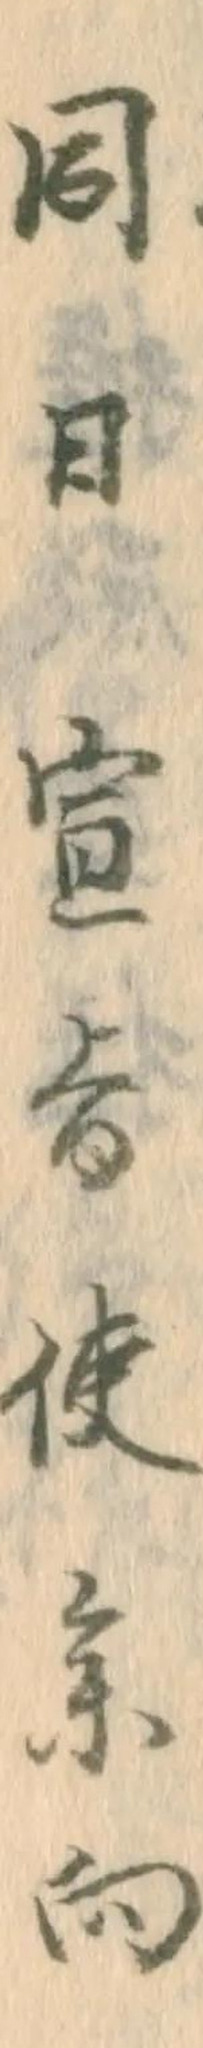同日宣旨使参向
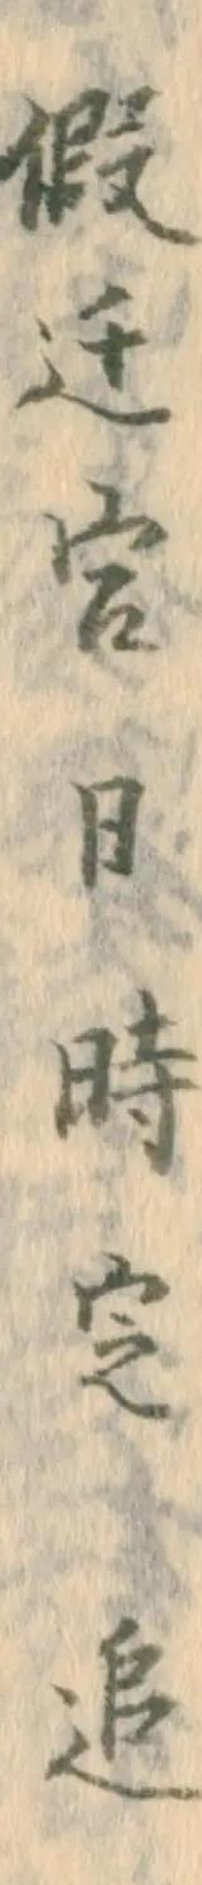仮迁宮日時定追
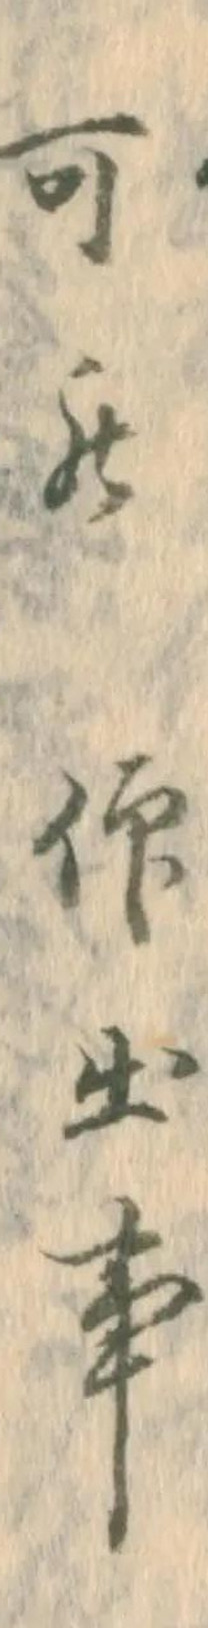可被仰出事
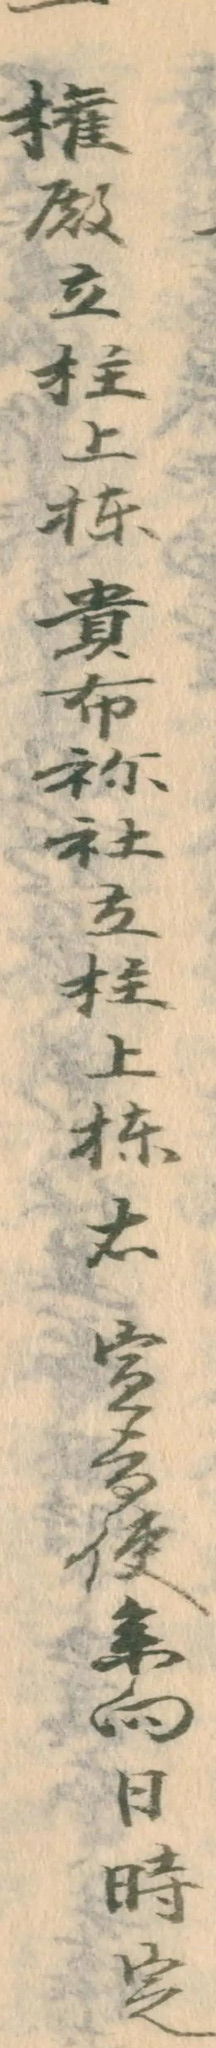一権殿立柱上棟貴布祢社立柱上棟右宣旨使参向日時定
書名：賀茂社記録. 第17冊
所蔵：国立国会図書館 National Diet Library, JAPAN
